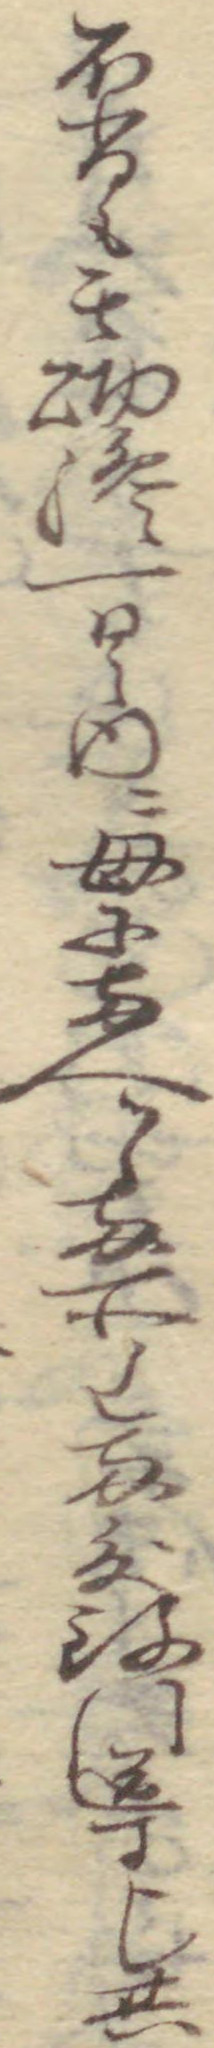不尚も其砌纔一日之内ニ母子両人ツヽ両所ニて両度致引導申候其
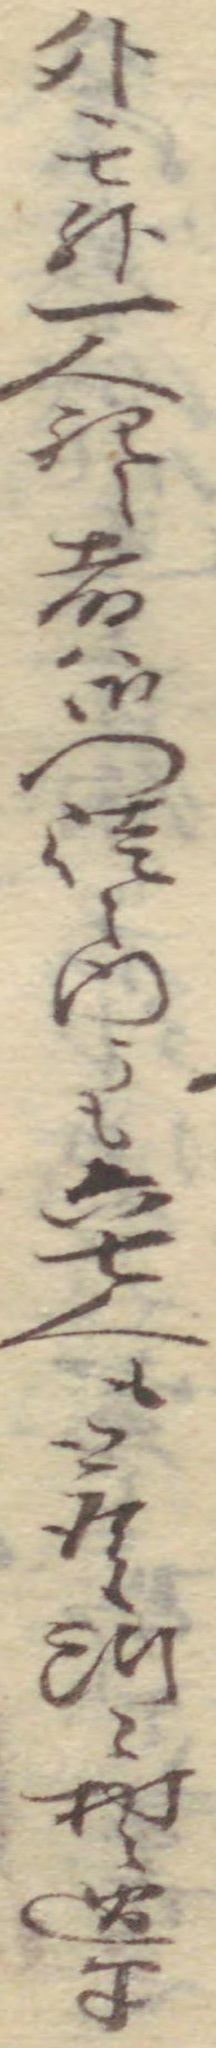外其外一人死之者ハ御門徒之内ニも六七人も御座候所〻村〻過半
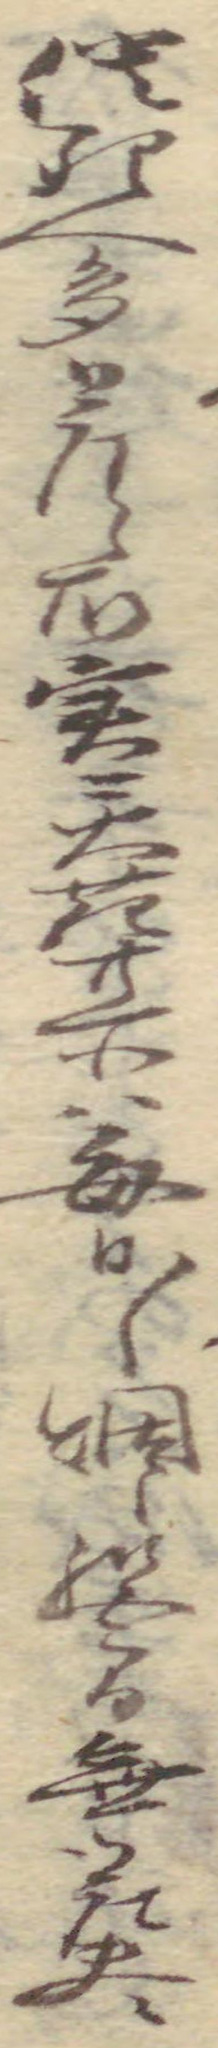潰即死多御座候所実ニ火葬所ハ毎日〳〵烟之絶間無御座夫ニ
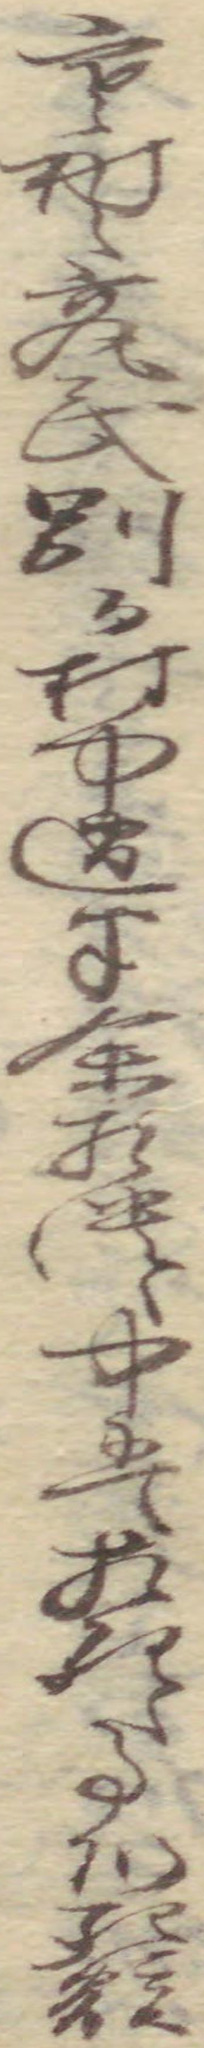寒初の窮民別て村中過半余相潰候中にて相死候事故死骸
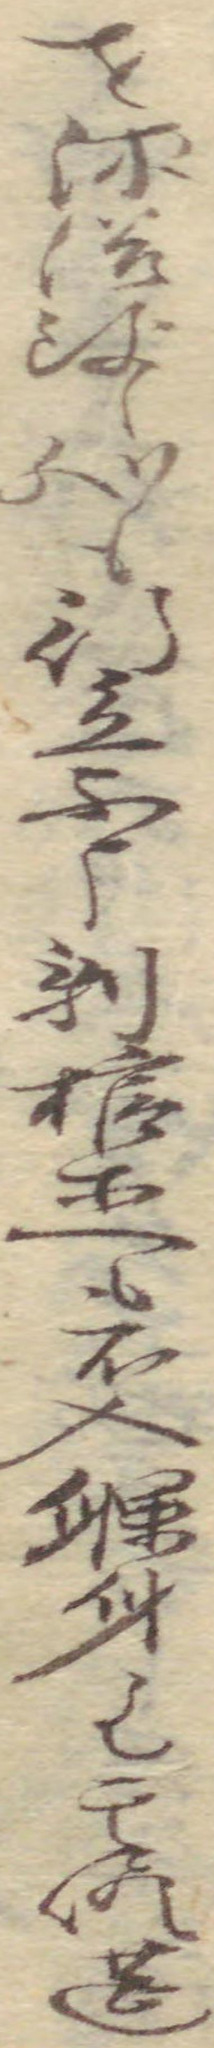を沐浴致候処も行立不申剰棺等へも不入裸身ニて其儘筵
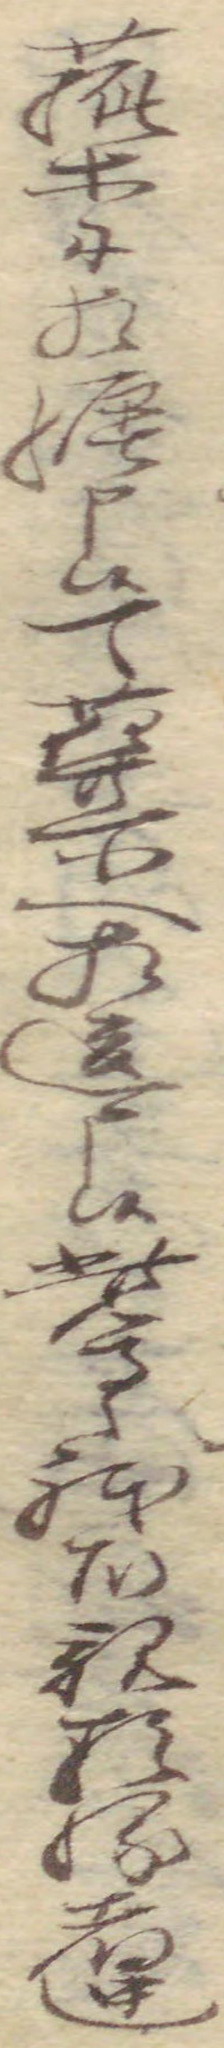菰等に相纏申候て葬所へ相送申候此等の体故親類縁者迚
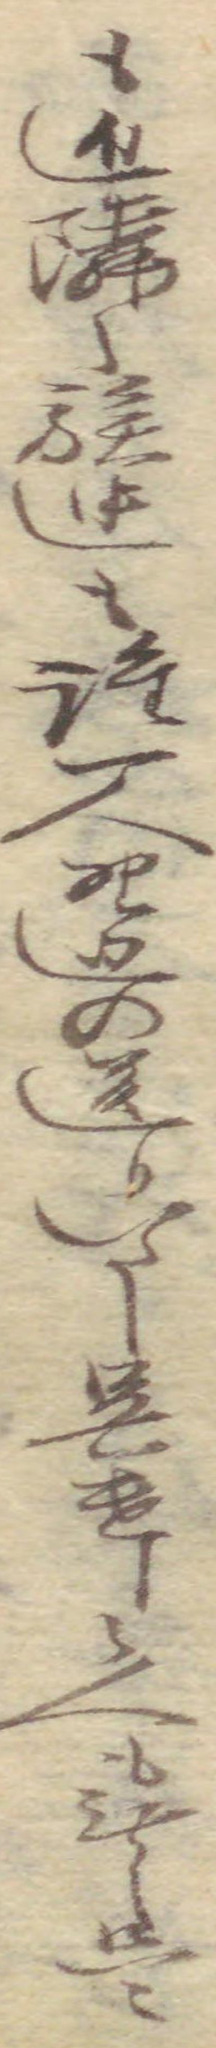も近隣之族迚も誰一人野辺の送りいたし呉進し候人も無之只〻
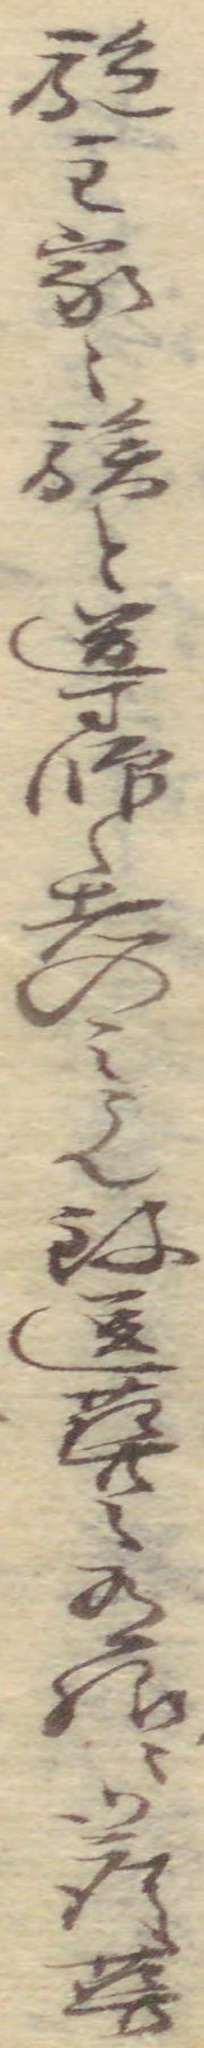施主家〻族と導師の者のミニて致送葬候有様ニ御座候葬
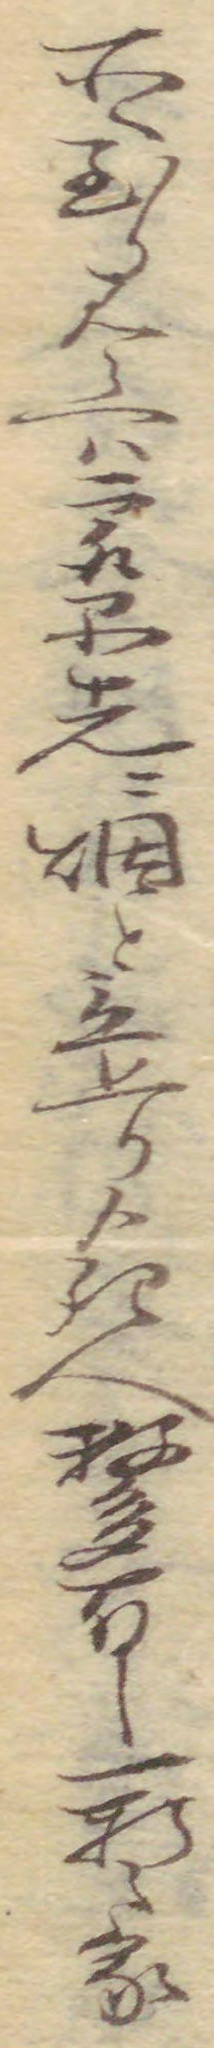所へ至り見候へハ最早先ニ烟と立上り候死人数多有之一軒之家

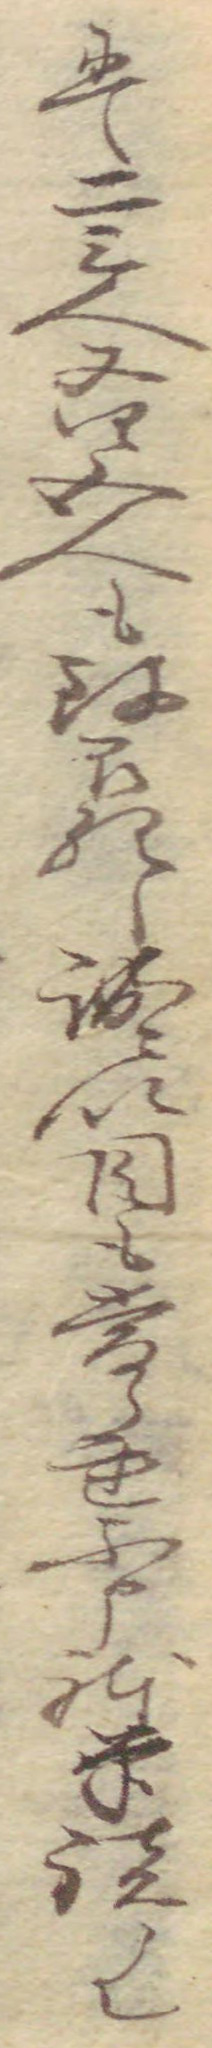にて二三人又四五人も致即死候誠ニ以目も当られ不申体筆談ニて
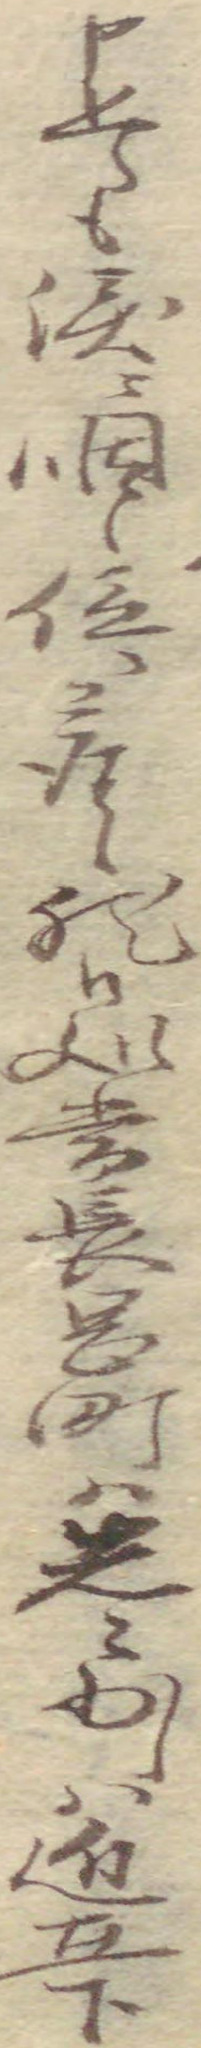申上候も涙ニ咽候位ニ御座候然ル処当長岡町ハ先〻少しハ近在下
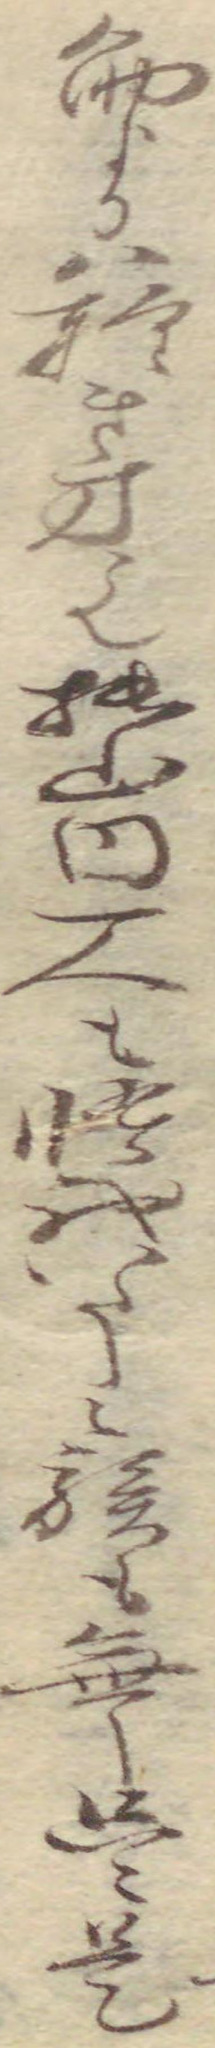筋よりハ軽き方ニて拙山内一人も怪我いたし候族も無之只〻是
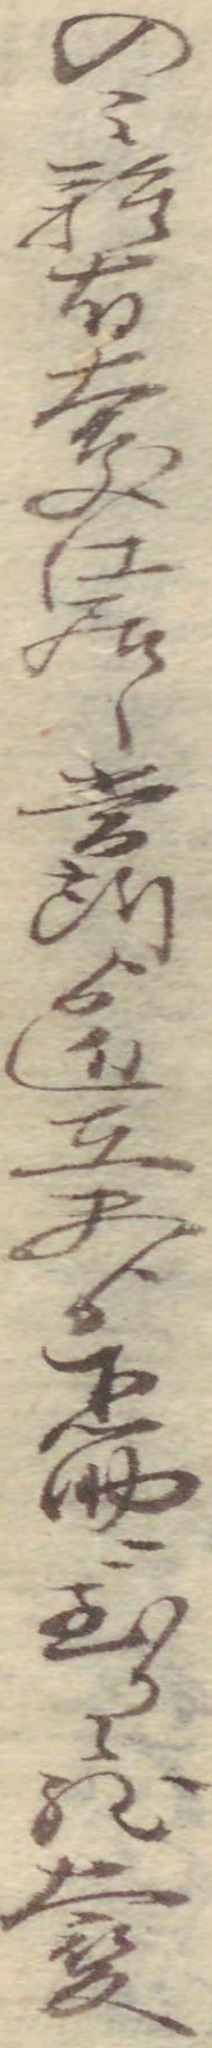のミ難有大慶仕居候当所ゟ近在夫ゟ下筋ニ至り候程大変
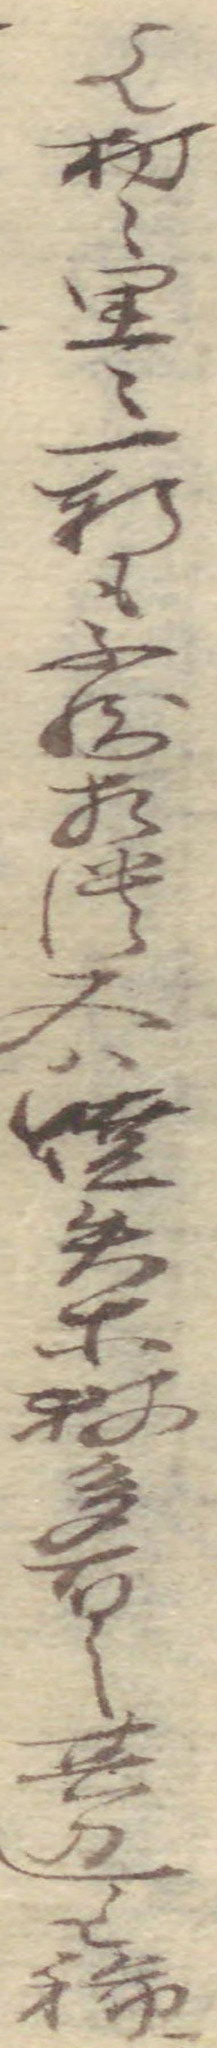ニて村〻里〻一軒も不残相潰又ハ消失等数多有之其辺ニて稀ニ
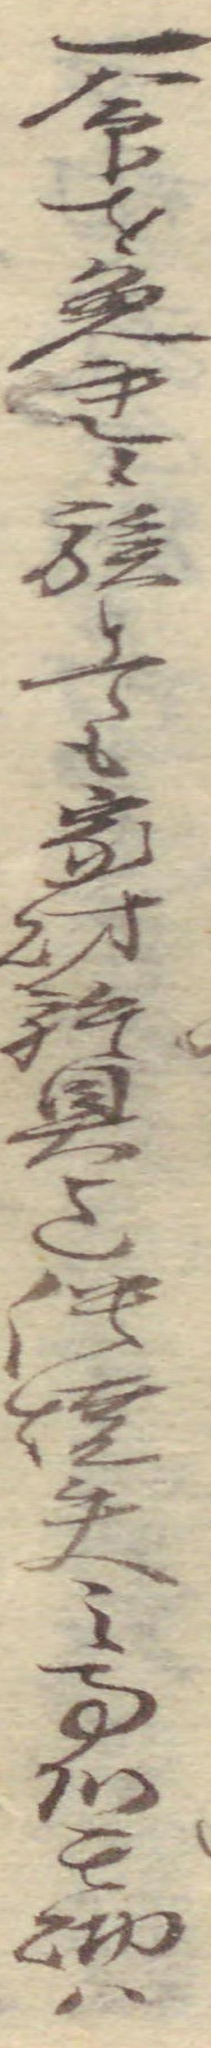一命を免れ候族とても家財夜具迄潰消失之之事故其砌ハ
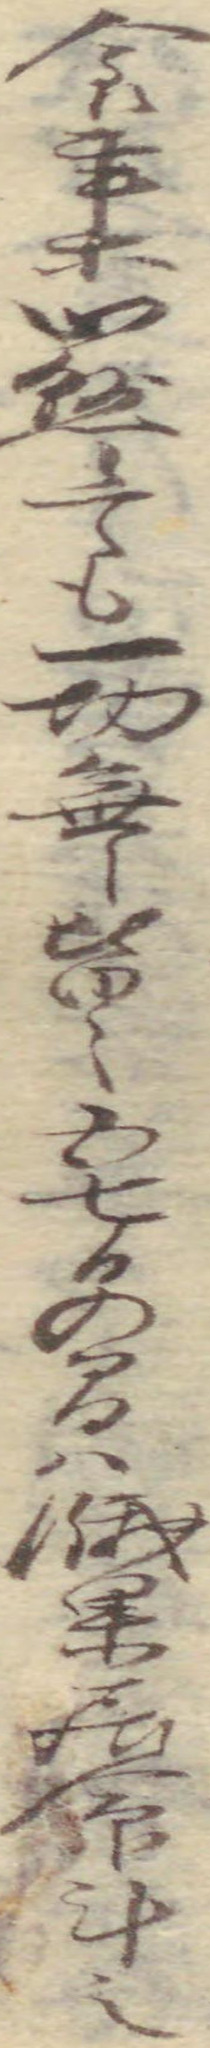食事等御懸ニても一切無之皆〻五七日の間ハ餓果居命計之
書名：鶯宿雑記. 巻199-200
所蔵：国立国会図書館 National Diet Library, JAPAN
